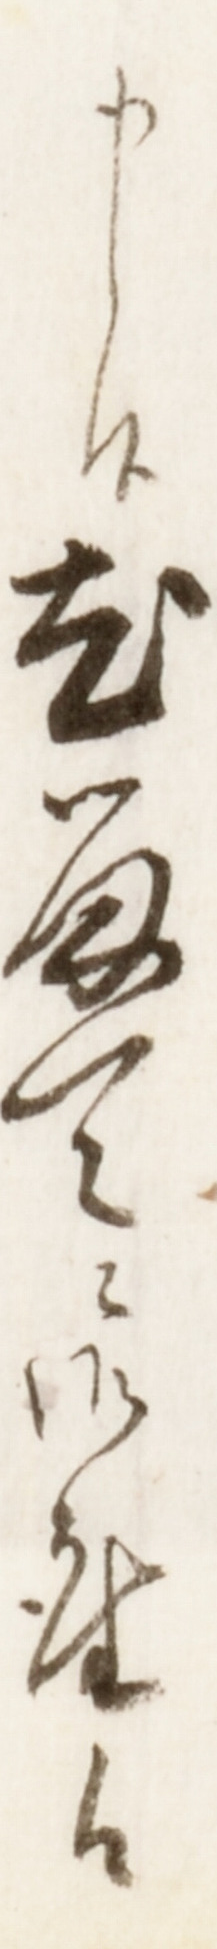申候尤雨天ニ御座候
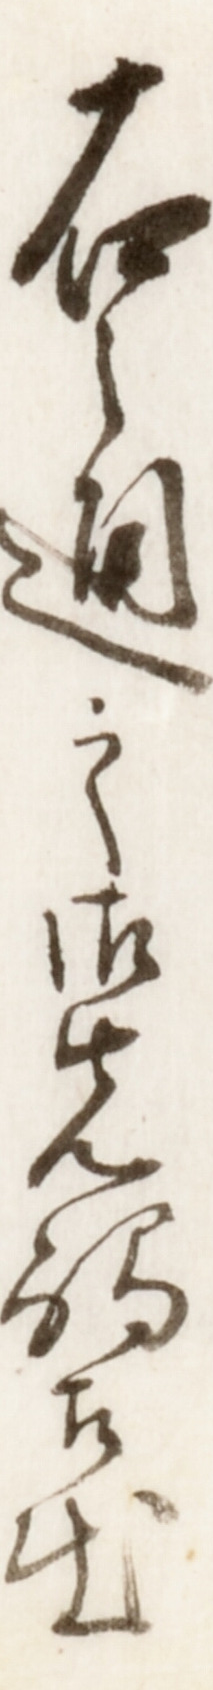右之通之御先触被出
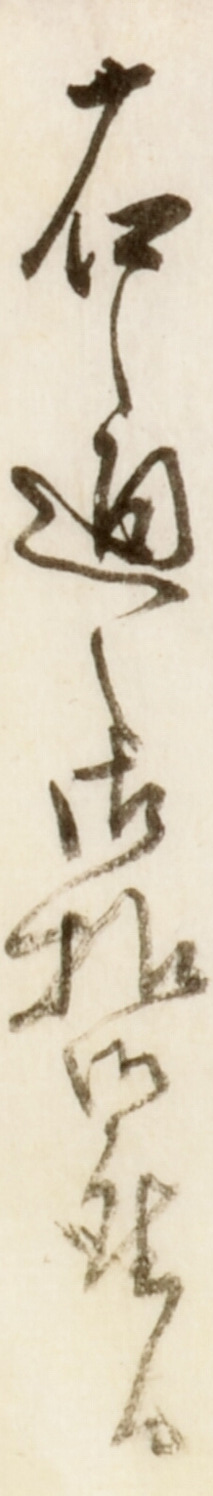右之通り御扣御座候

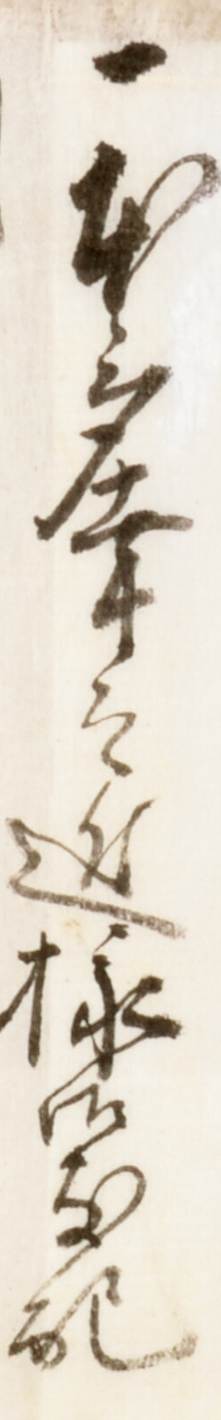一本多幸之進様御支配
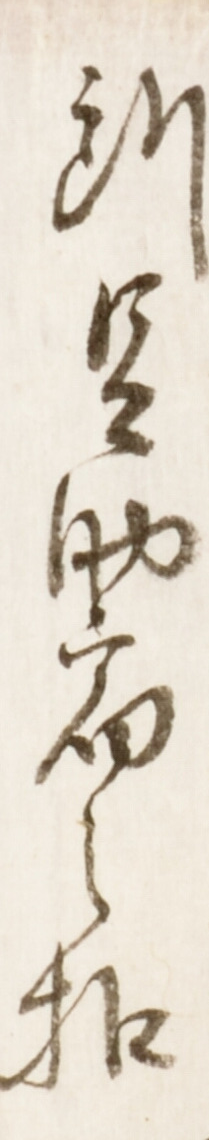所足助宿之扣
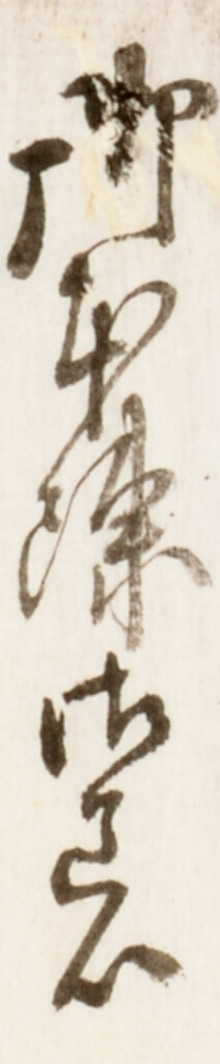御本陣御着
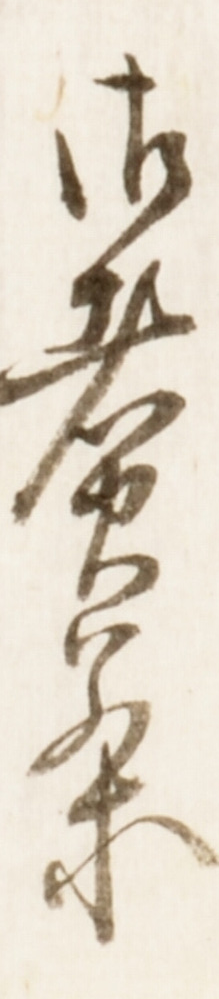御煮茶
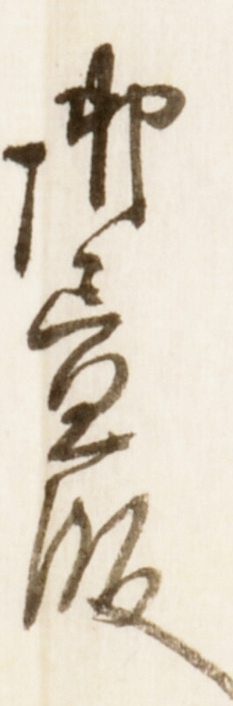御昼飯
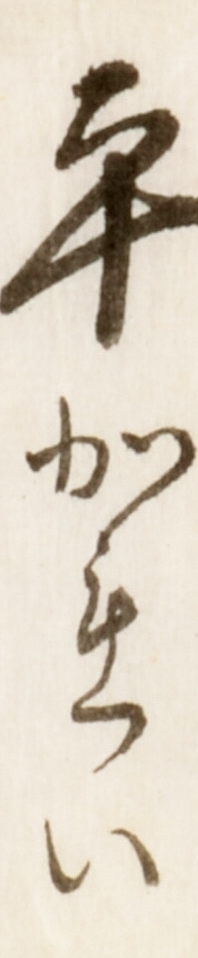平かれい
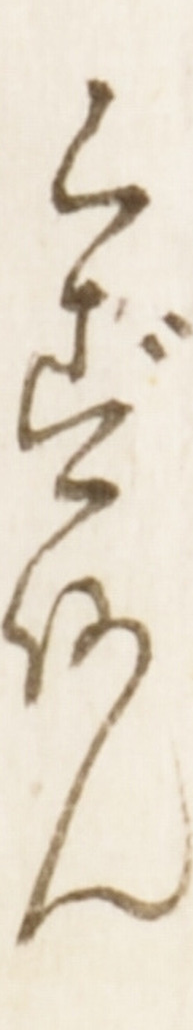くずあん
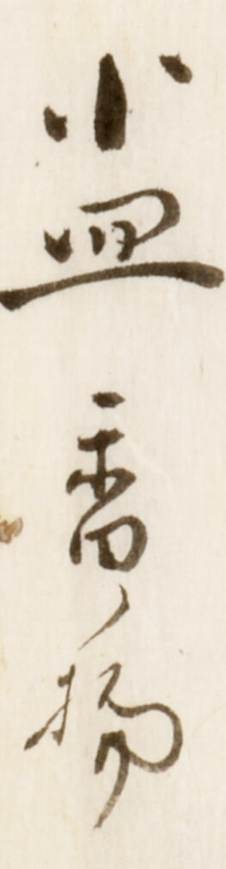小皿香ノ物
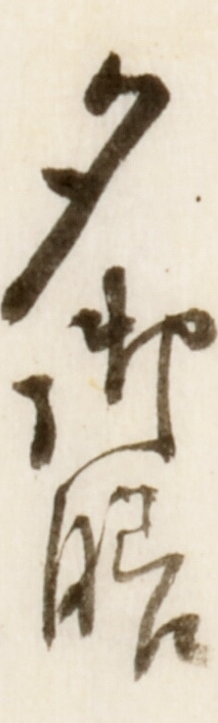夕御膳
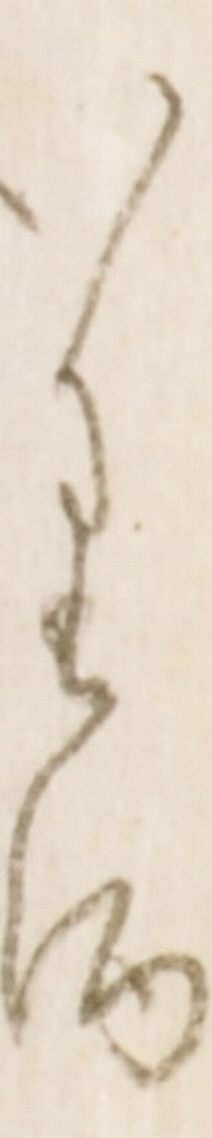いり酒

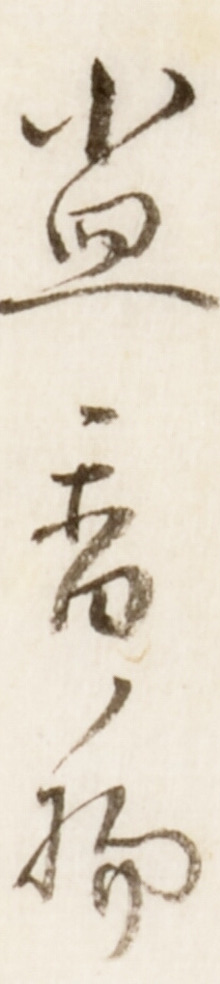小皿香ノ物
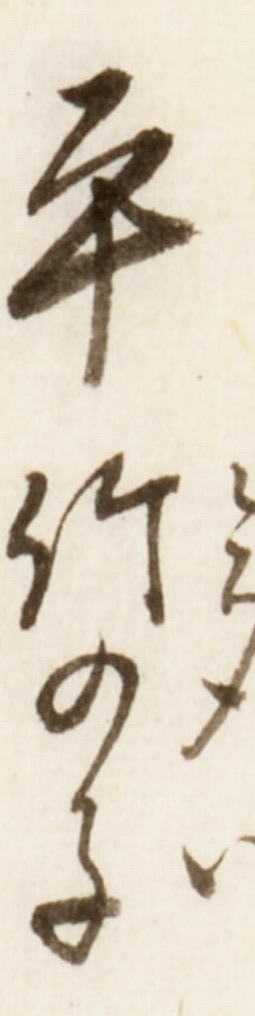平竹の子
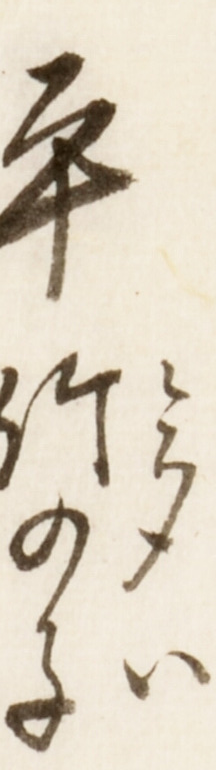平竹の子
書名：（諸事控）
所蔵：伊那市立高遠町図書館・合同会社AMANE
